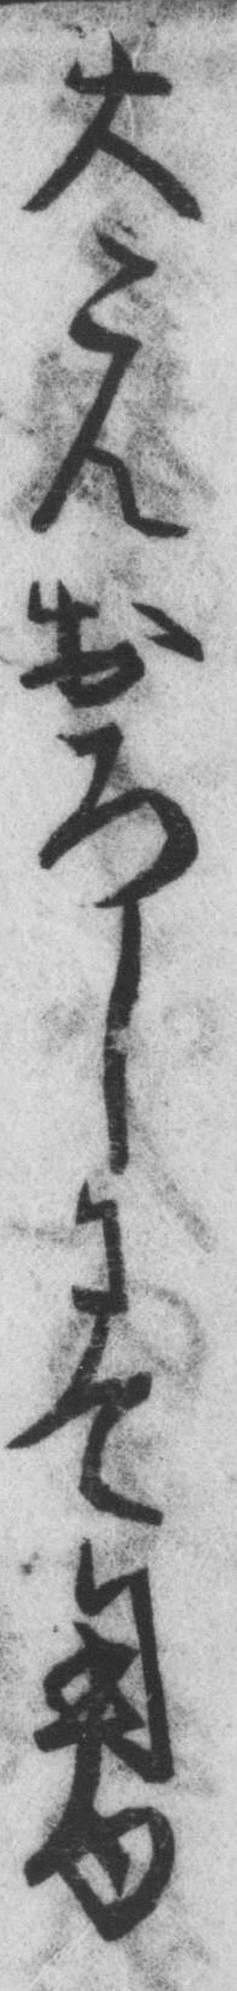大こんおろしにて用ゆ
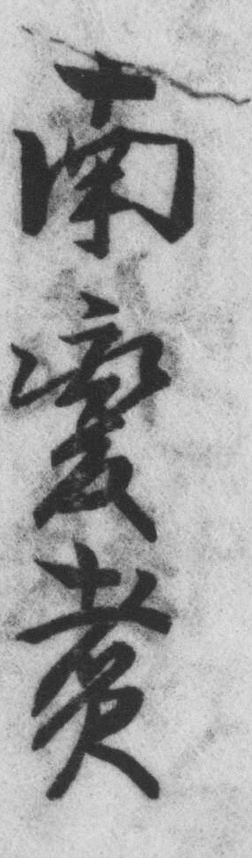南蛮煮
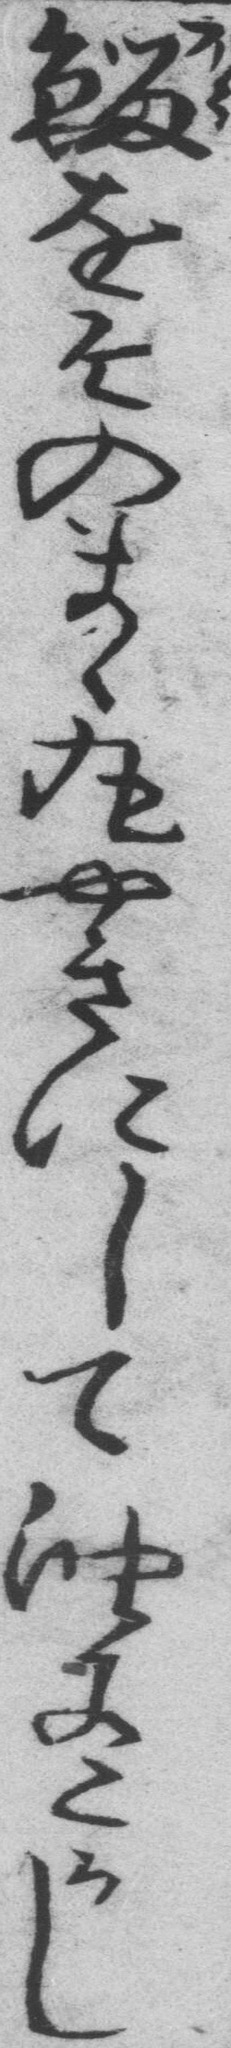鯔をそのまゝ丸やきにして油にこかし
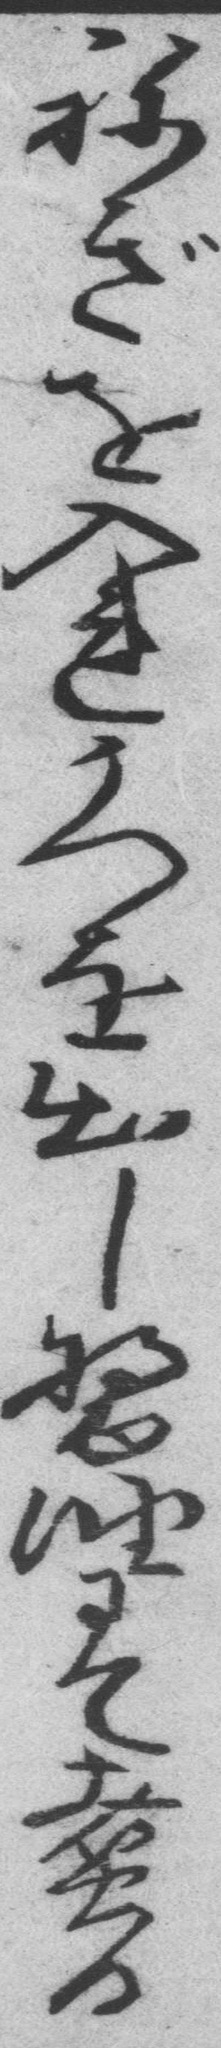ねぎを入れかつを出し醤油にて煮る
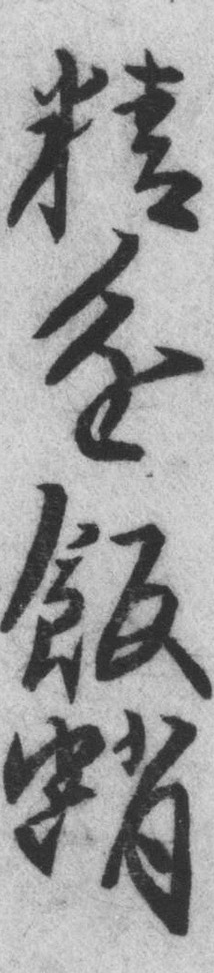精進飯蛸
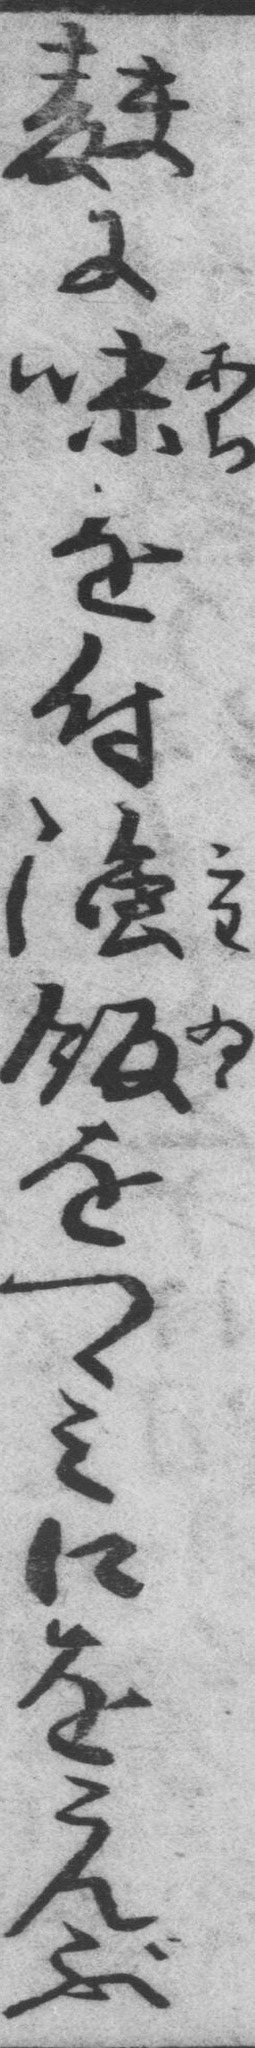麩に味を付強飯をつゝみ口をこんぶ
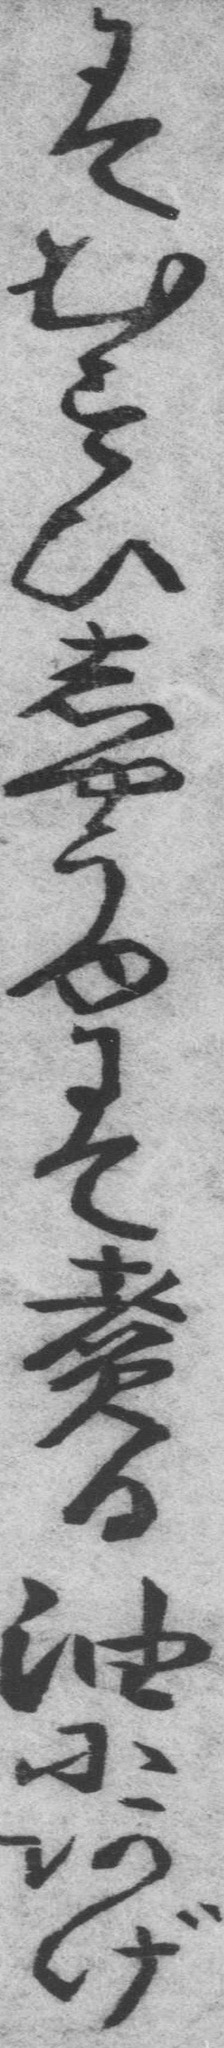にてむすひしやうゆにて煮る油にあげ
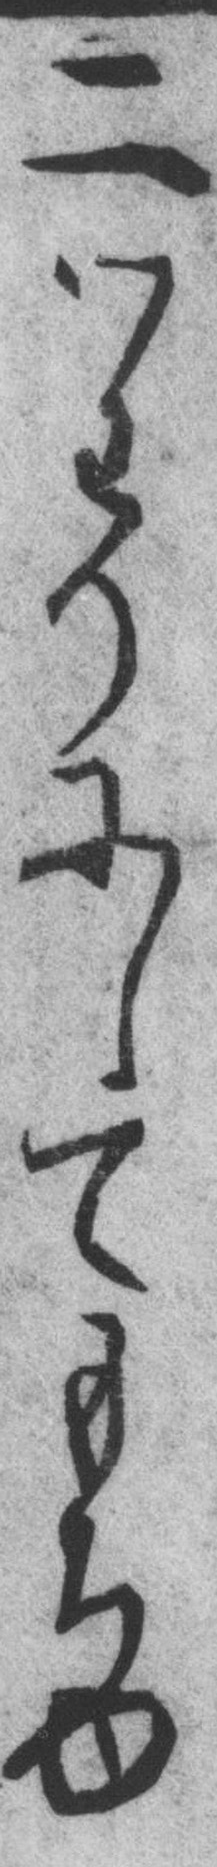二つわりにしてもちゆ
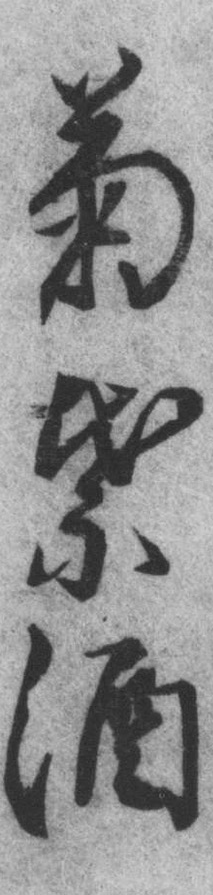菊葉酒

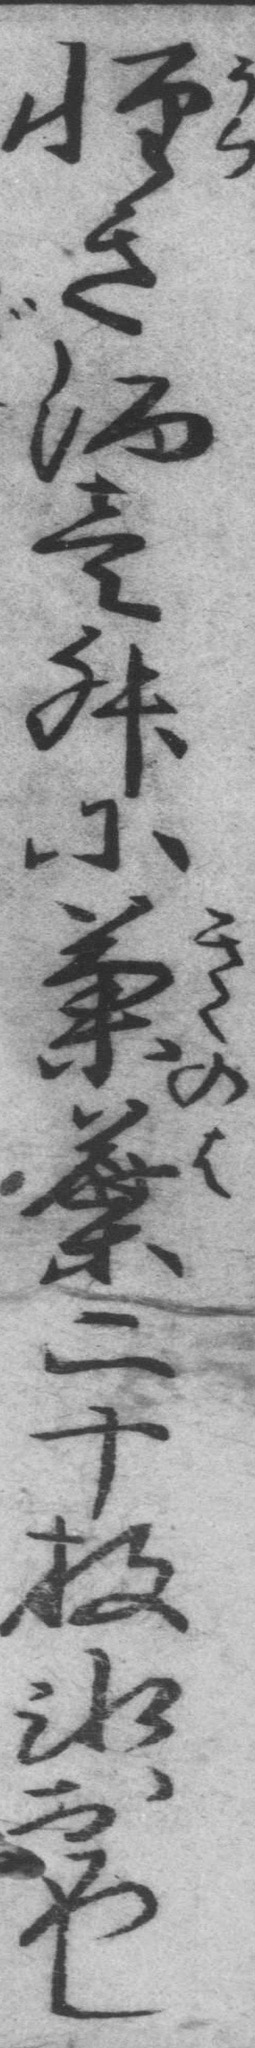軽き酒壱升に菊葉二十枚氷おろし
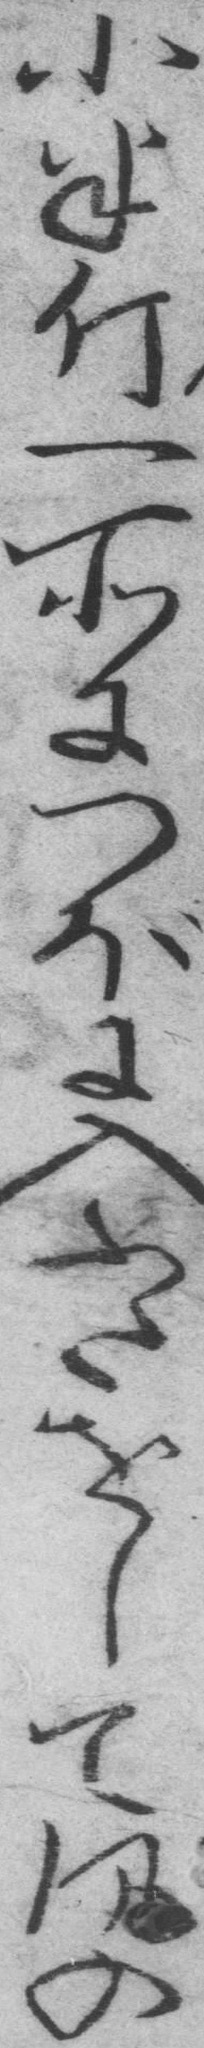小半斤一所につぼに入ふたをして風の
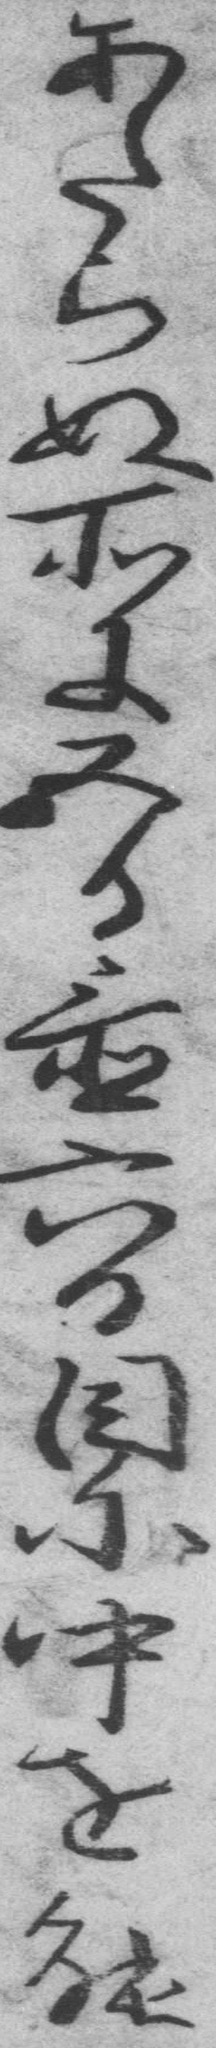あたらぬ所に五日置六日目に中を能
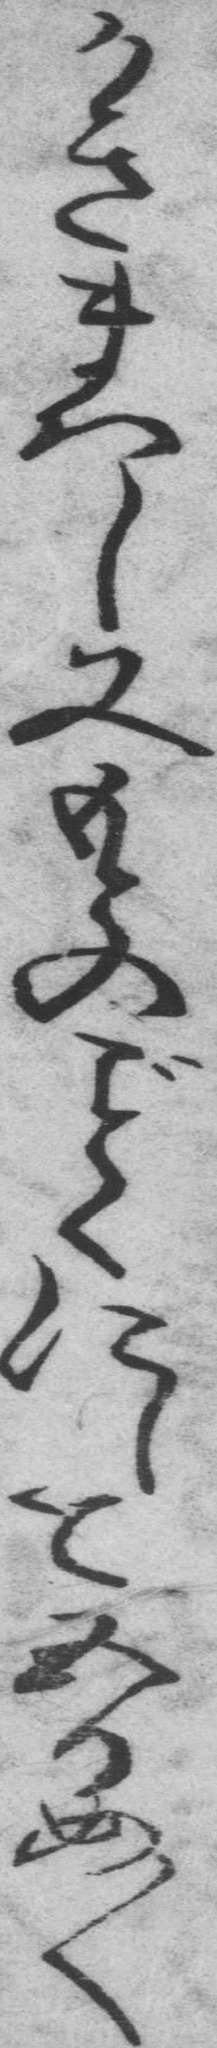かきまはし又もとのごとくにして五日め〳〵
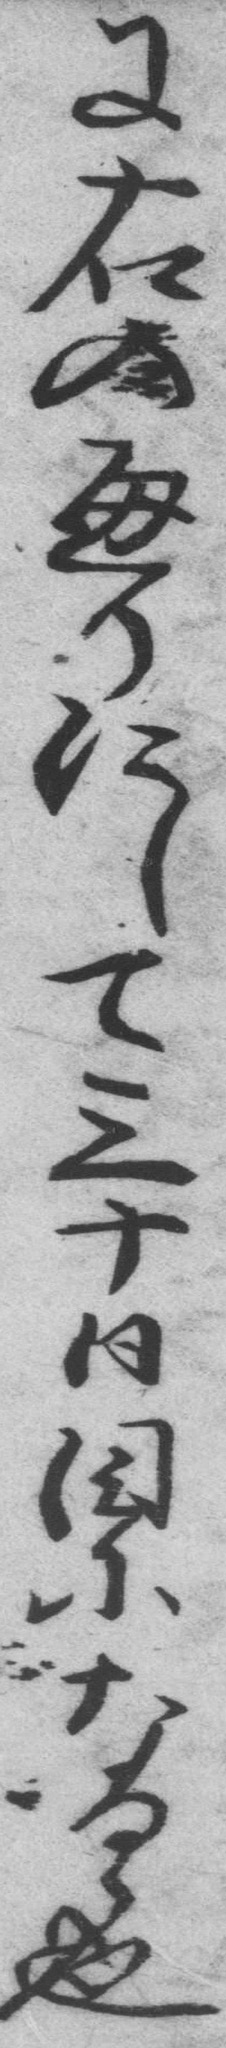に右の通りにして三十日目になるゝ也
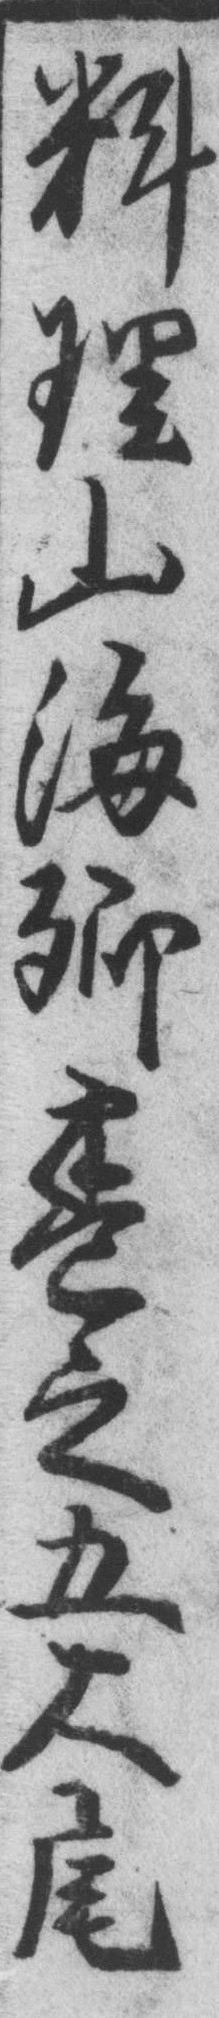料理山海郷巻之五大尾
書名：料理山海郷
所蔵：大阪府立大学学術情報センター 国文学研究資料館
